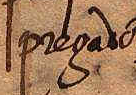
pregador
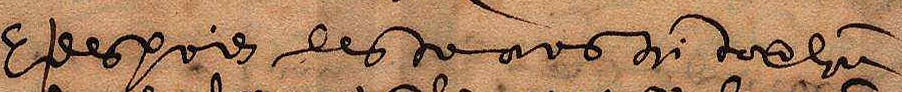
E despois desto aos trīta e hū
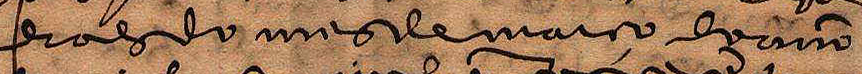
dias do mes de março do anō
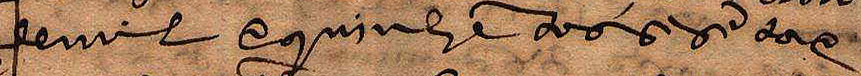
de miL e quinhētos sesēta e
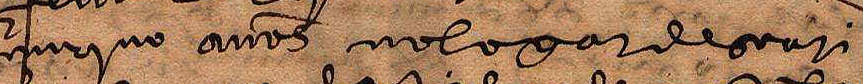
çimquo anōs no logar de scari
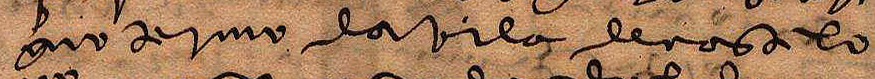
guo termo da vila de castelo
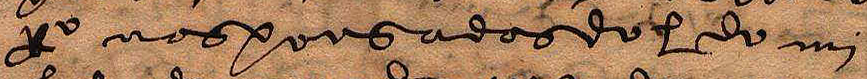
Ro nas pousadas do Ldo mj
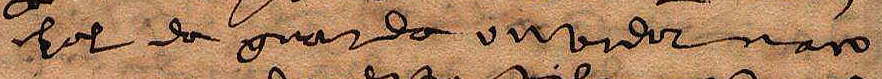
chel da guarda ouvidor na co
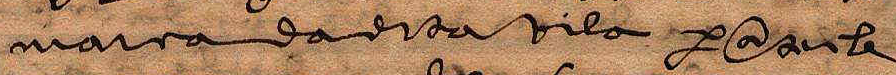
marca da dita vila ꝑāte ele
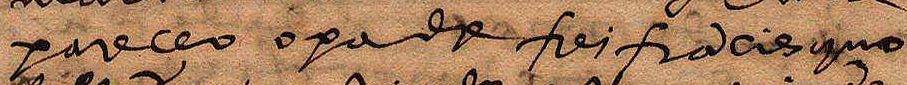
pareçeo o padre frei frācisquo
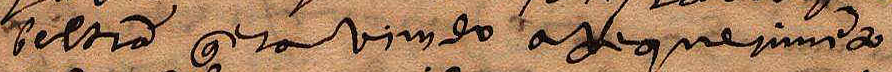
beltrā q̄ era vimdo a Requerimēto
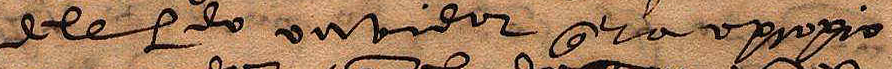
dele Ldo ouvidor q̄ era o propio
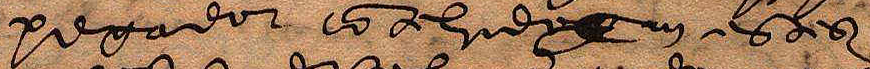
pregador cōtehudo em estes
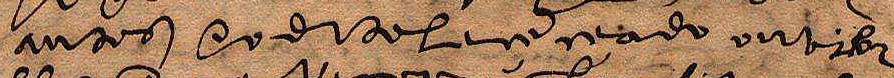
autos e o dito Leçēçeado ouvidor
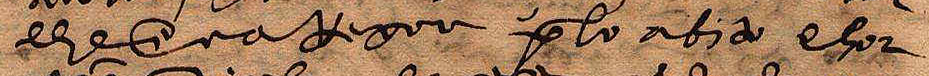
lhe ēcaRegou p̄lo abito e hor
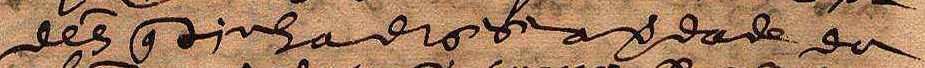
deēs q̄ tinha disese a ꝟdade da
